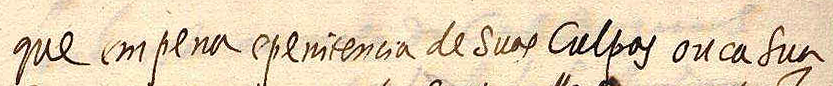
que em pena e penitencia de suas culpas ouça sua
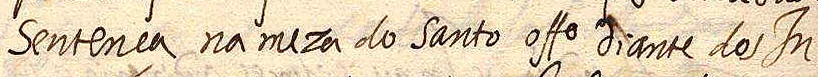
Sentença na meza do Santo offo diante dos In
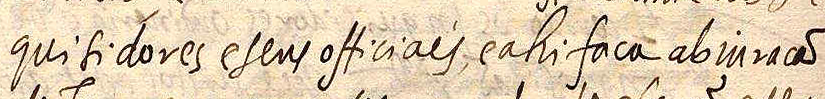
quisidores e seus officiaes, e ahi faça abiuraçaõ
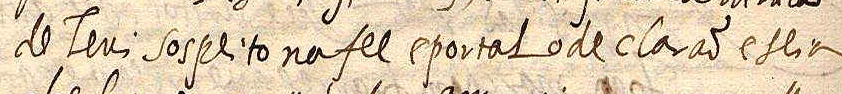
de Leui sospeito na fee e por tal o declaraõ e seia
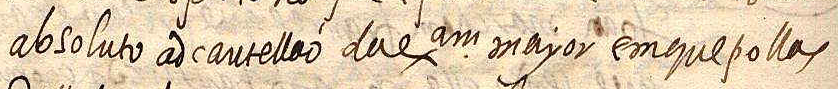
absoluto ad cautellaõ da exam. mayor em que pollas
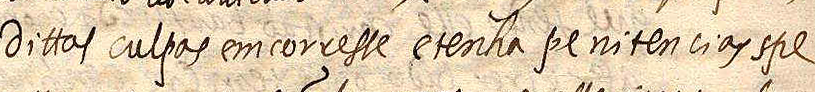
dittas culpas emcorresse e tenha penitencias spe
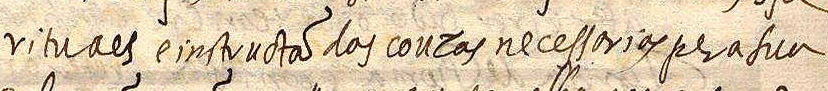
rituaes e instructaõ das couzas necessarias pera sua
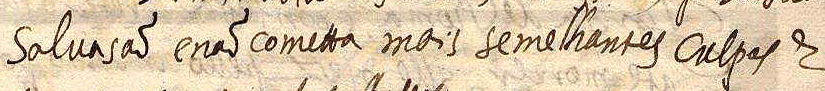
saluasaõ e naõ cometta mais semelhantes culpas E
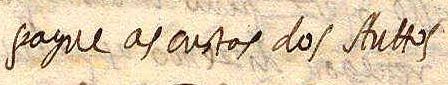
pague as custas dos Auttos
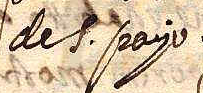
de s. payo
